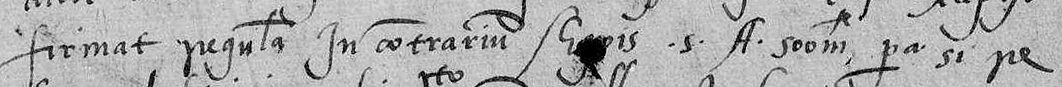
firmat regūla Jn c̄otrarīu / E _ois .s. A. soomte ꝑa si re
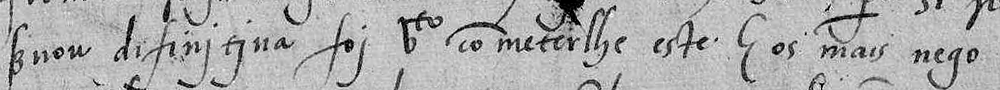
ꞩuou difinjtjua foj vto c̄ometerlhe este E os mais nego
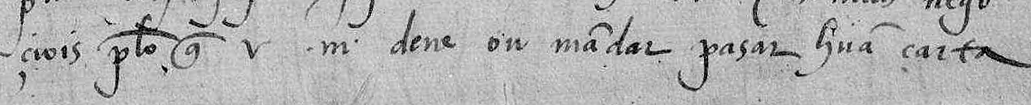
ciois p̄lo q̄ v .m. deue ou mādar pasar huā carta
